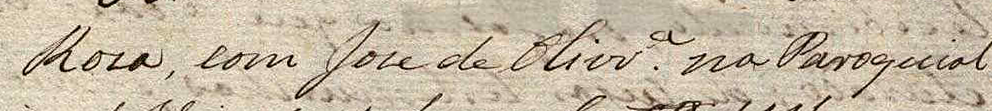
Roza, com Joze de Olivr.a na Paroquial
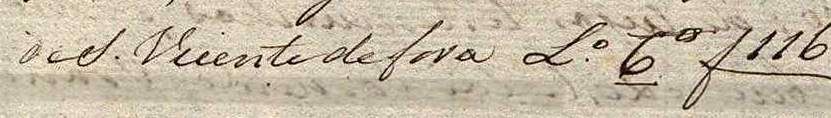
de S. Vicente de fora L.o 6.o f.116
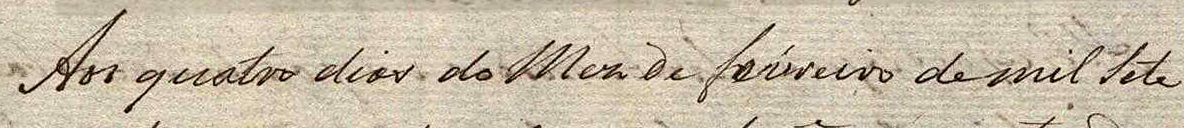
Aos quatro dias do Mez de fevreiro de mil sete
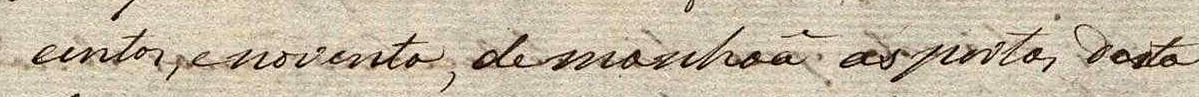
centos, e noventa, de manhaã as portas desta
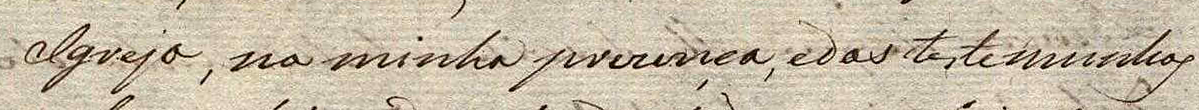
Igreja, na minha prezença, e das testemunhas
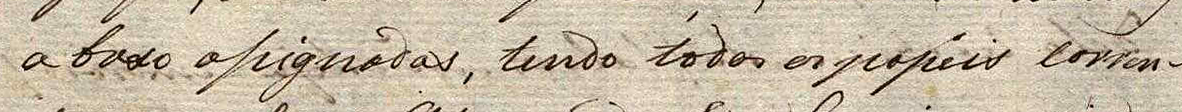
abaxo assignadas, tendo todos os papeis corren
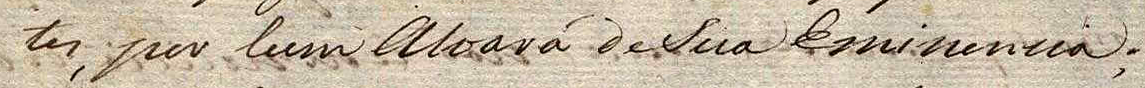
tes, por hum Alvará de Sua Eminencia;
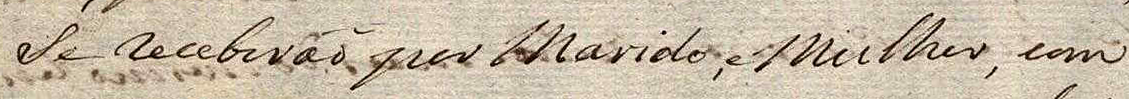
se receberaõ por Marido, e mulher, com
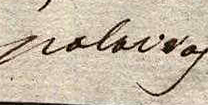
palavras
